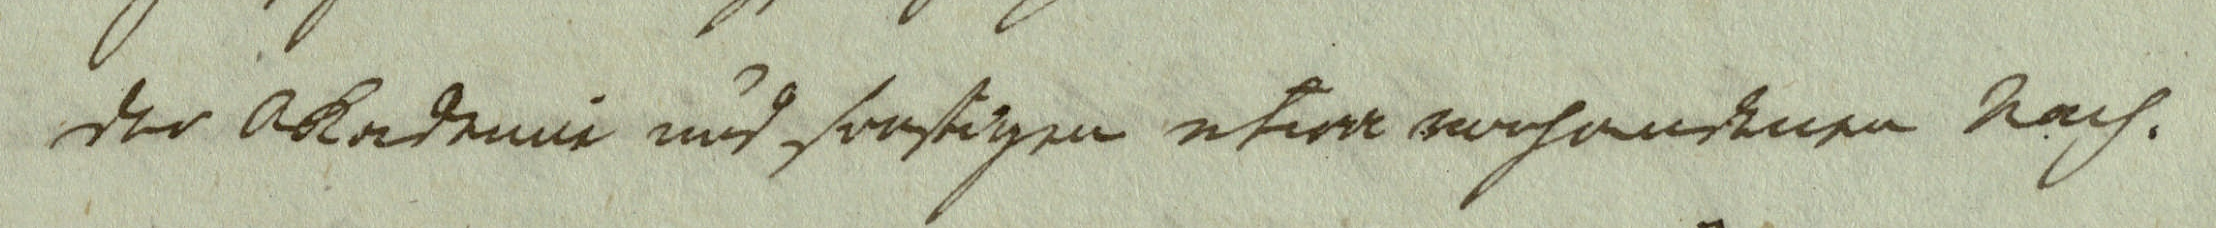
der Akademie und sonstigen etwa vorhandenen Nach¬
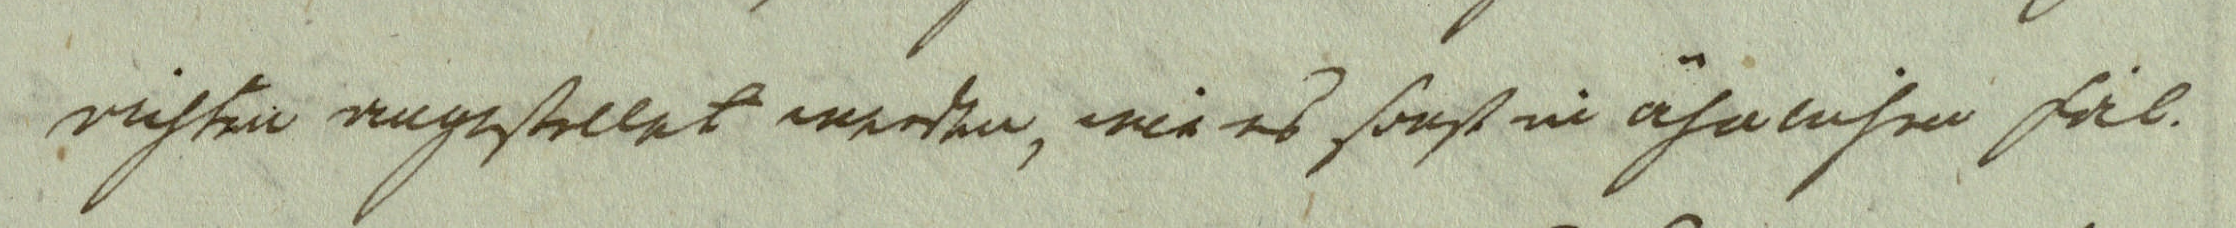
richten angestellet werden, wie es sonst in ähnlichen Fäl¬
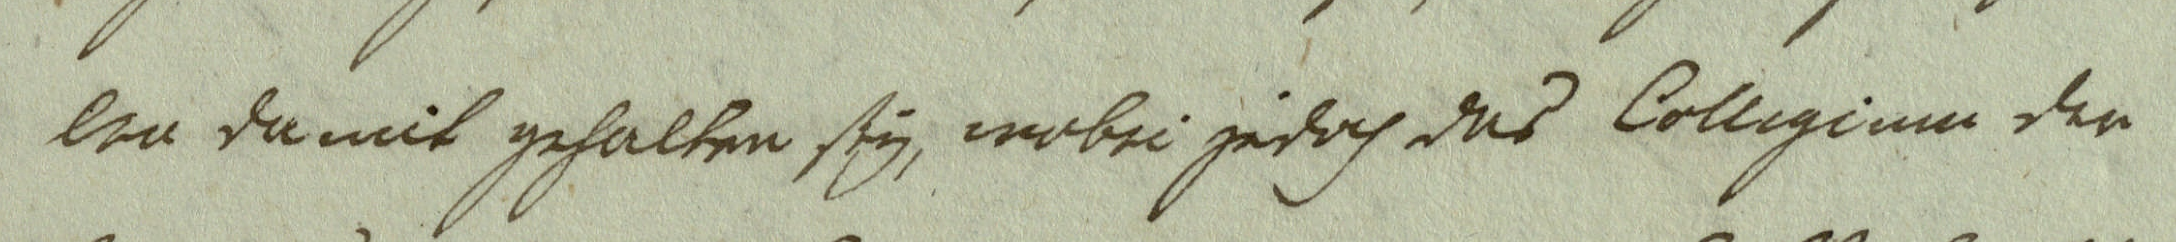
len damit gehalten seÿ, wobei jedoch das Collegium der
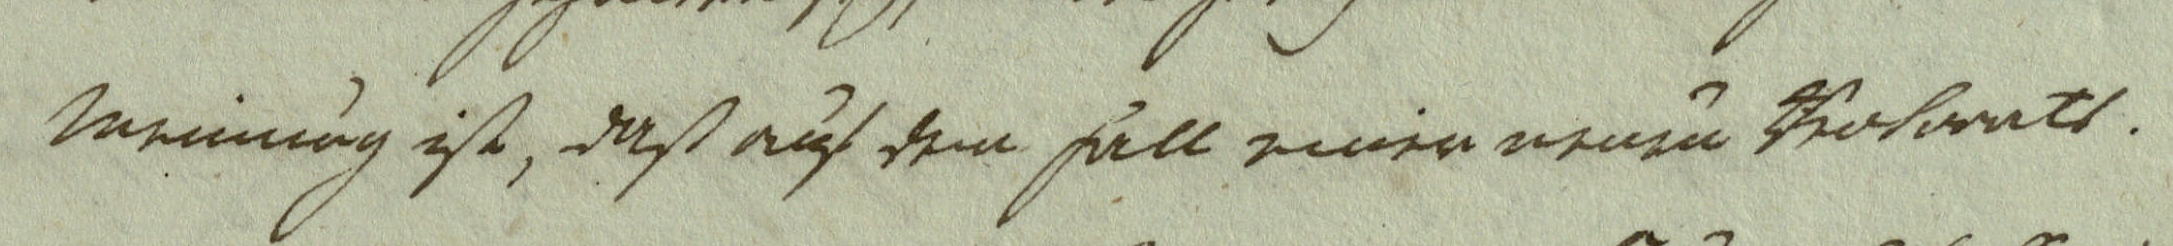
Meinung ist, daß auf dem Fall einer neuen Rectorats¬
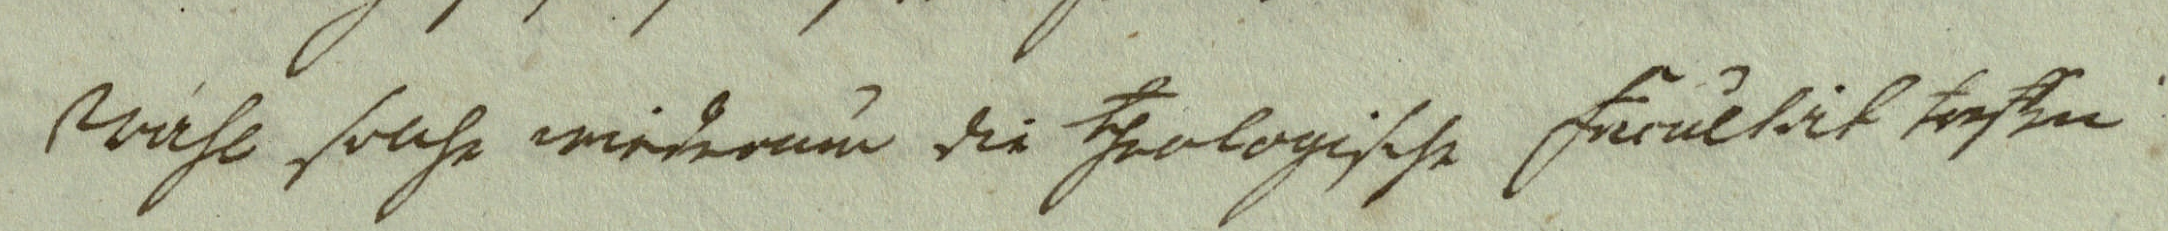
Wahl solche wiederum die Theologische Facultät treffen
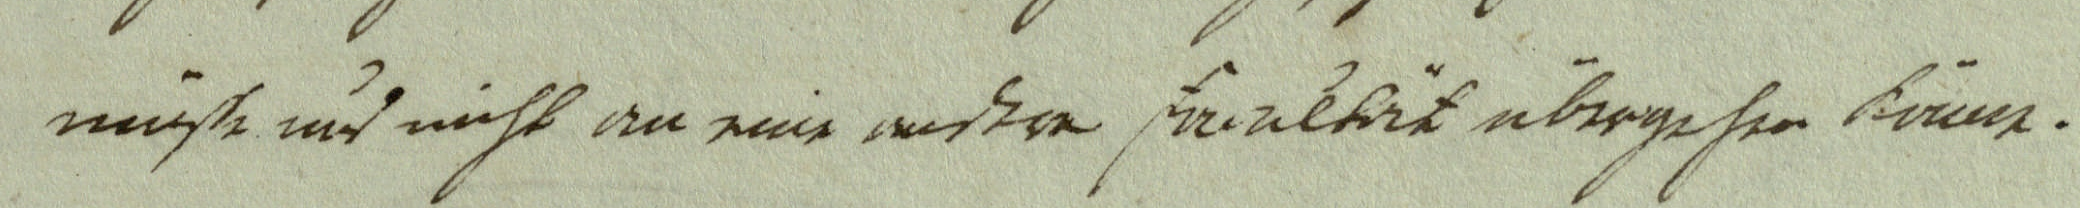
müsse und nicht an eine andere Facultät übergehen könne.
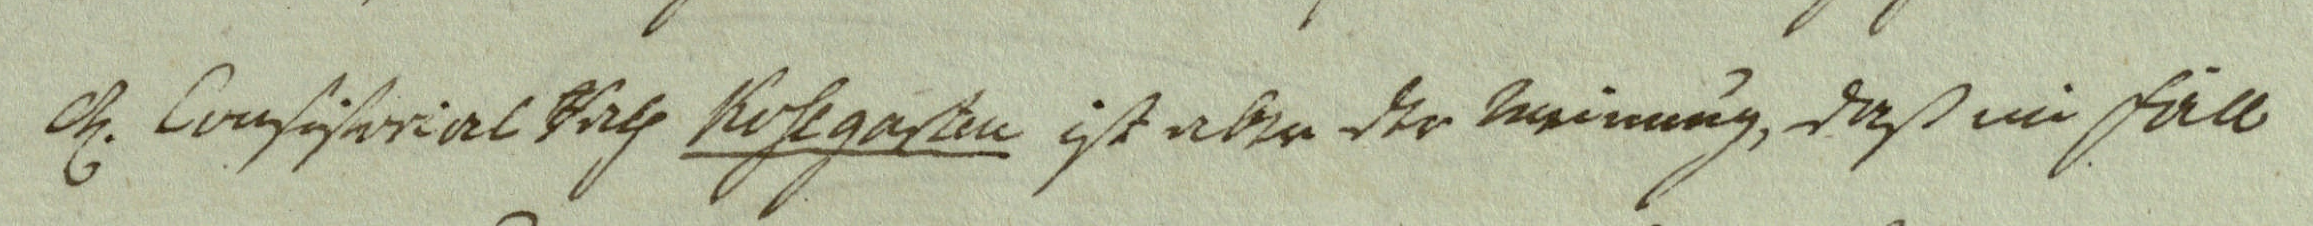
dh. Consisorial Rath Kosegarten ist aber der Meinung, daß im Fall
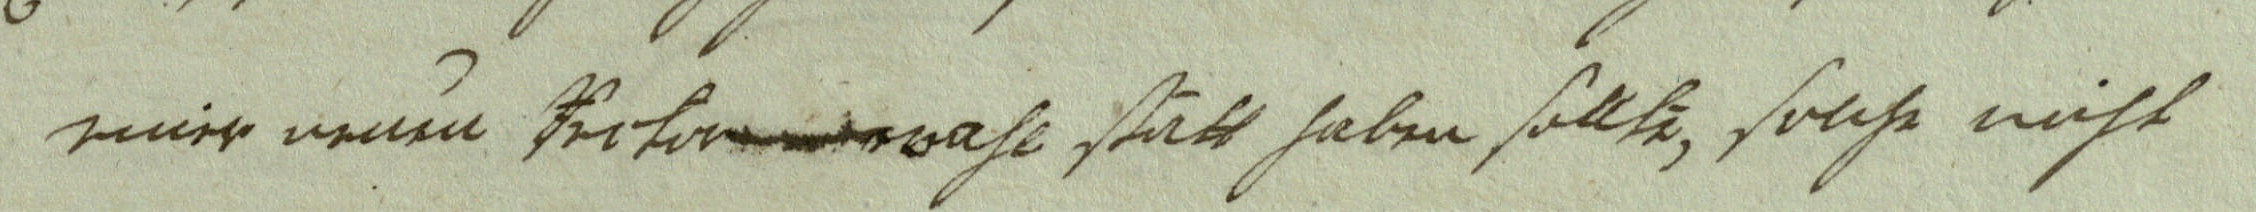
einer neuen Rectorwiederwahl statt haben sollte, solche nicht
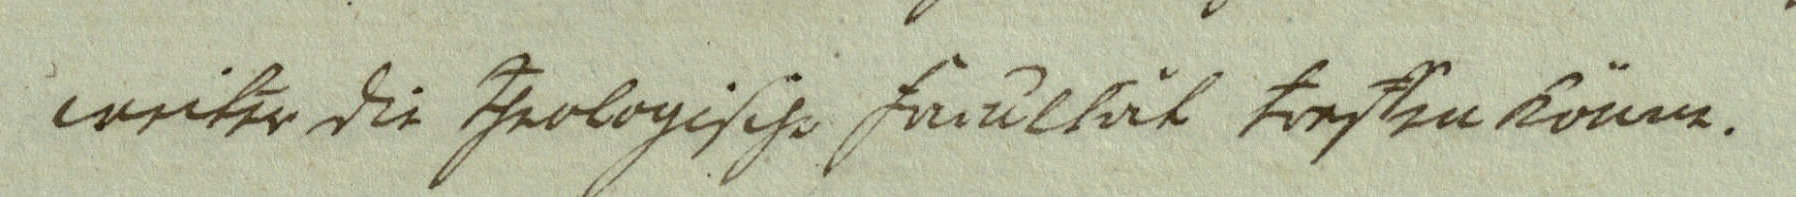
weiter die Theologische Facultät treffen könne.
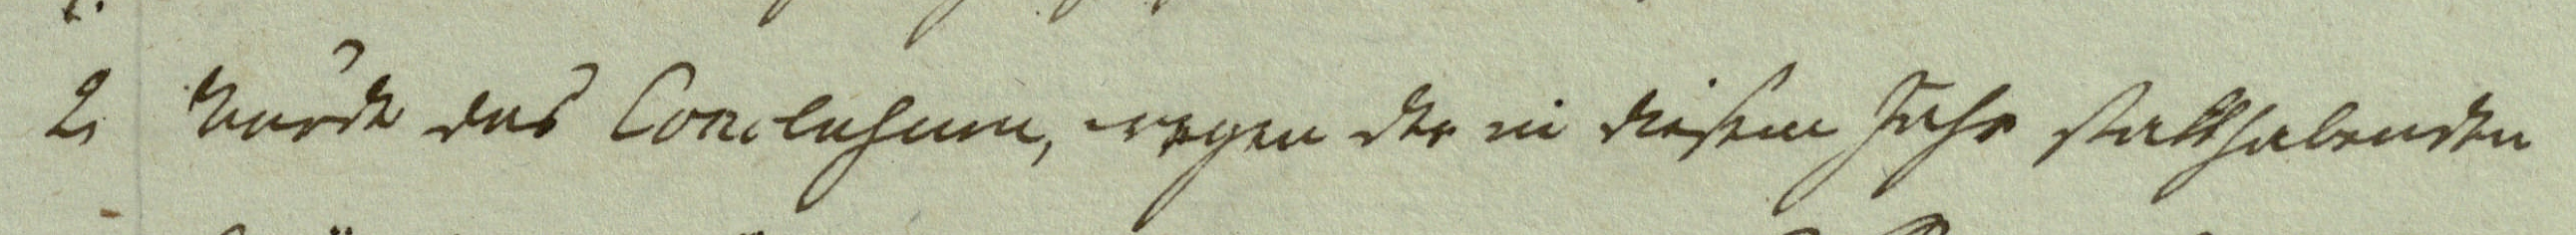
2. Wurde das Conclusum, wegen der in diesem statthabenden
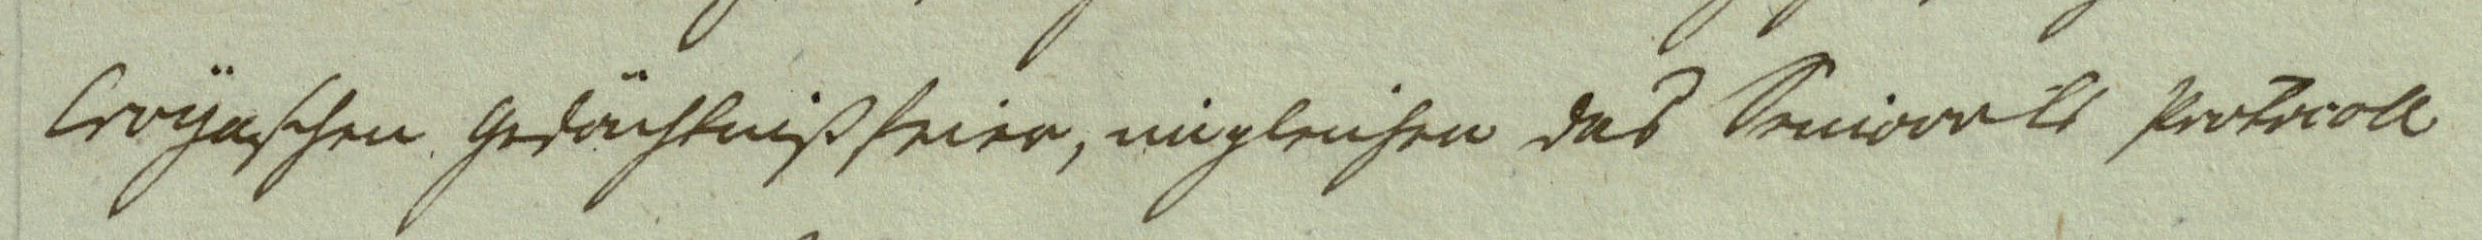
Croÿeschen Gedächtnißfeier, imgleichen das Seniorats Protocoll
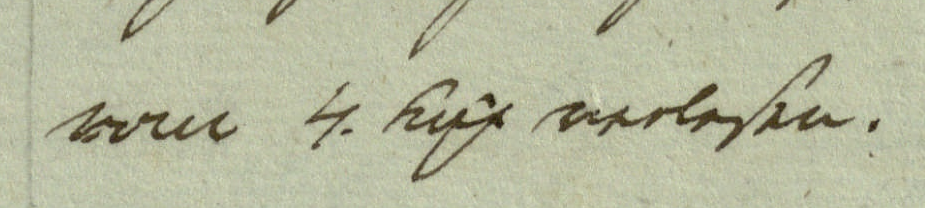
vom 4. huj. verlesen.
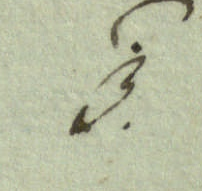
3.
